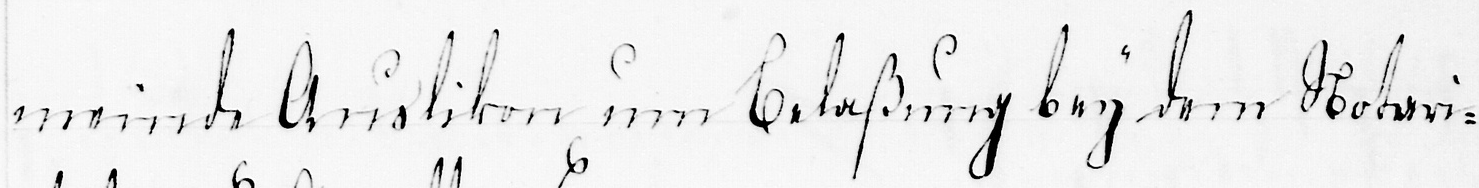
meinde Auslikon um Belaßung bey dem Notari¬
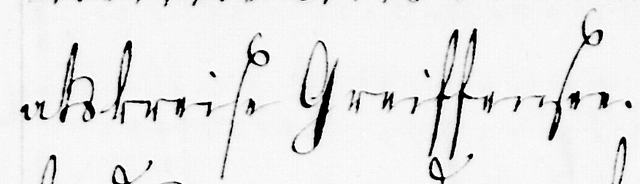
atskreise Greiffensee.
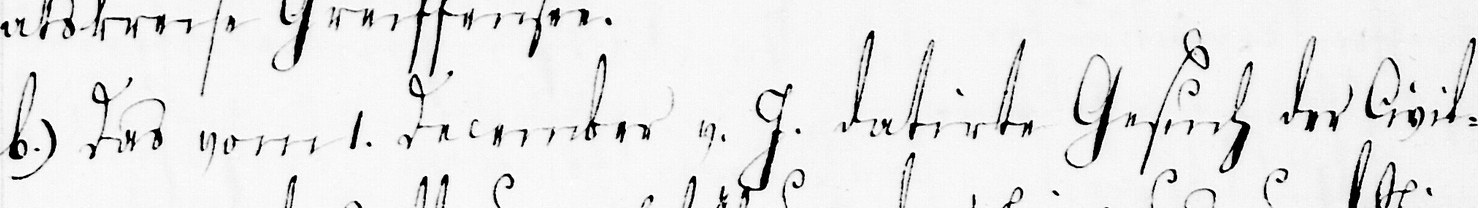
b.) Das vom 1. December v. J. datirte Gesuch der Civil¬
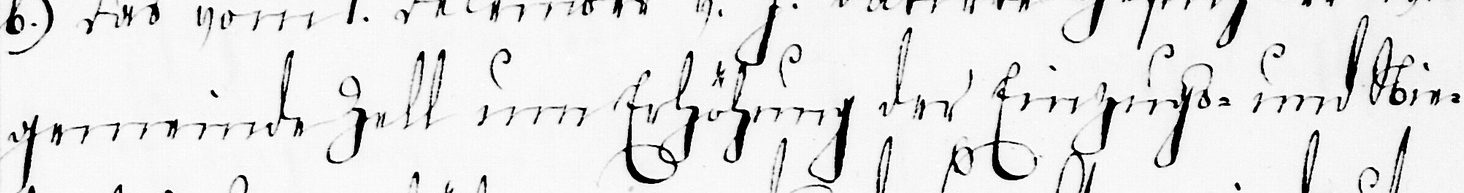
gemeinde Zell um Erhöhung der Einzugs- und Nie¬
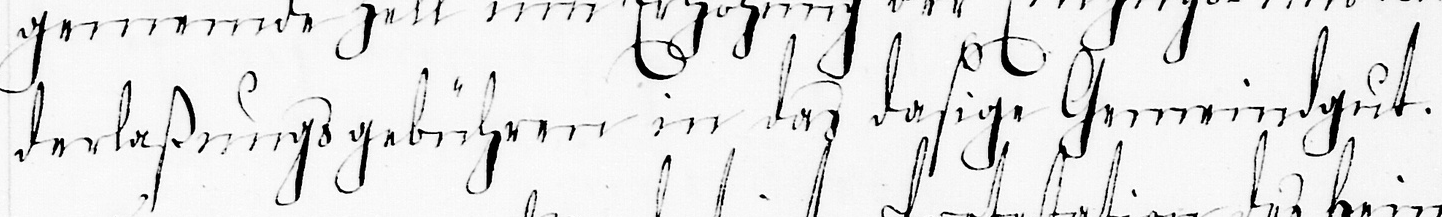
derlaßungsgebühren in das dasige Gemeindgut.
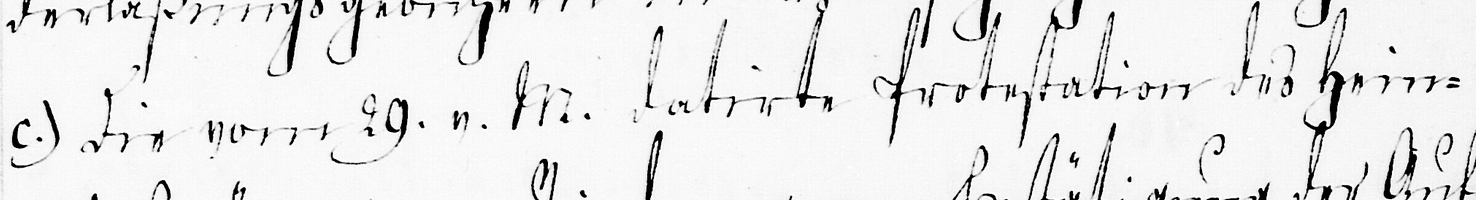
c.) Die vom 29. v. M. datirte Protestation des Hein¬
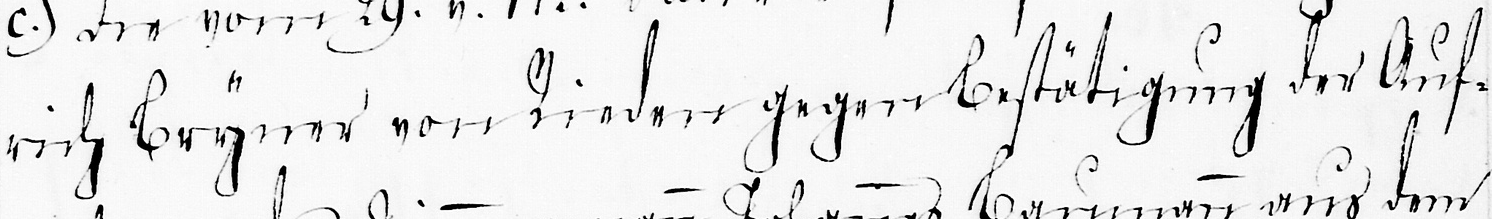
rich Bryner von Rieden gegen Bestätigung der Auf¬
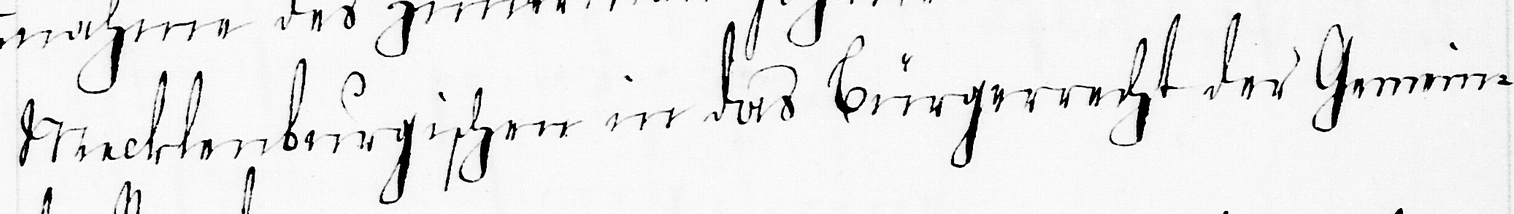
Mecklenburgischen in das Bürgerrecht der Gemein¬
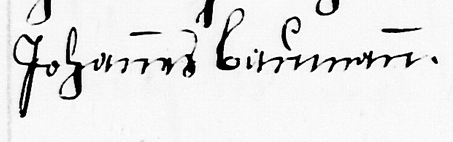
Johannes Baumann
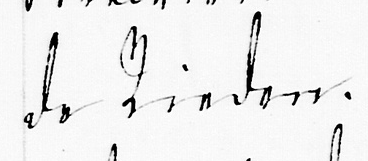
de Rieden.
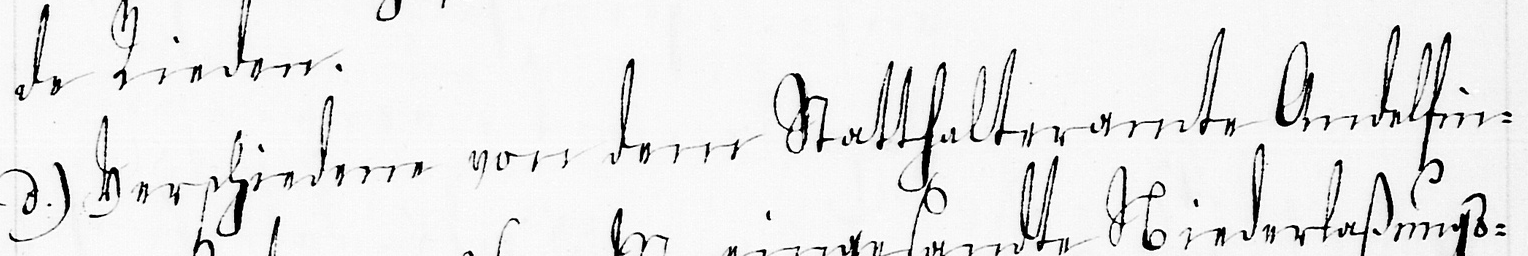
d.) Verschiedene von dem Statthalteramte Andelfin¬
